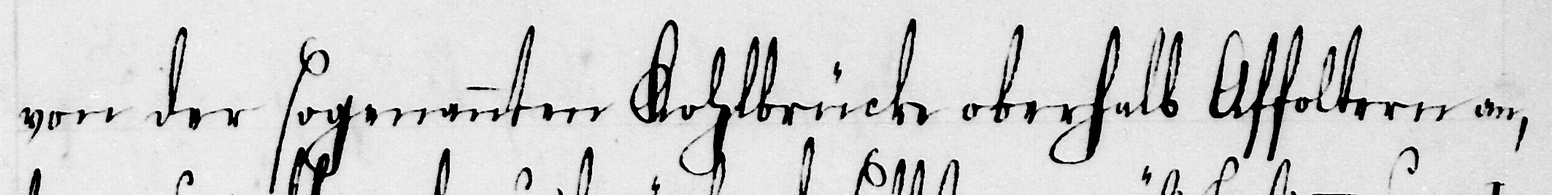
von der sogenannten Kohlbrücke oberhalb Affoltern an,
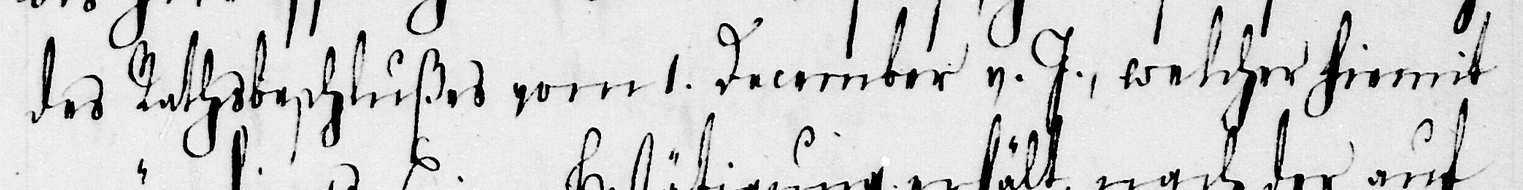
des Rathsbeschlußes vom 1. December v. J., welcher hiemit
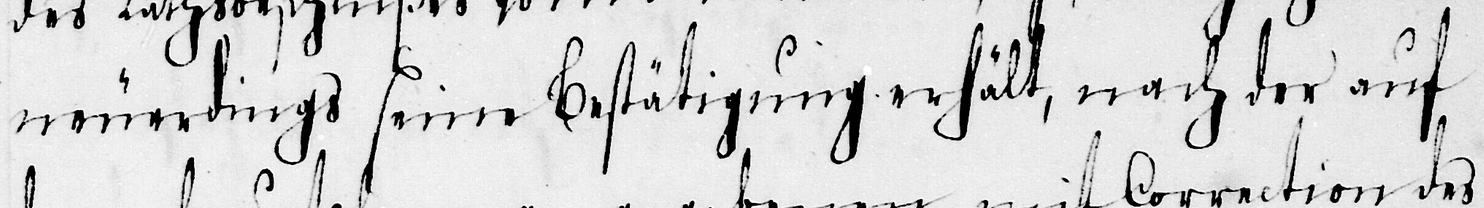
neuerdings seine Bestätigung erhält, nach der auf
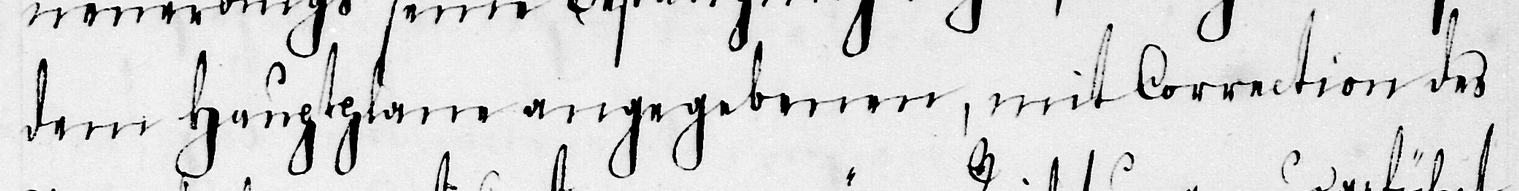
dem Hauptplane angegebenen, mit Correction des
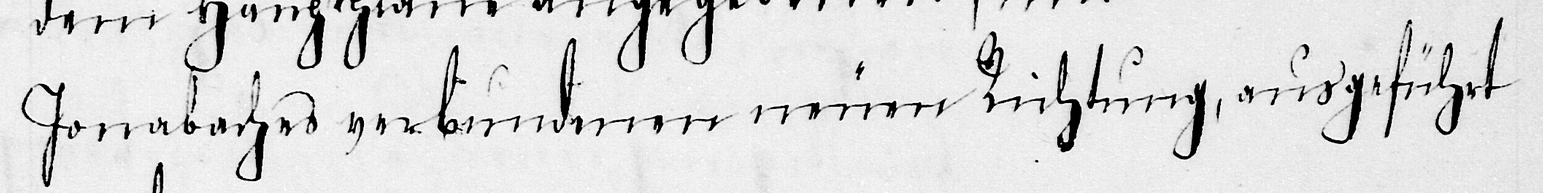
Jonabaches verbundenen neuen Richtung, ausgeführt
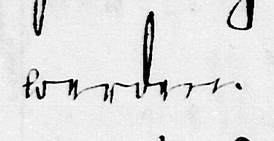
werden.
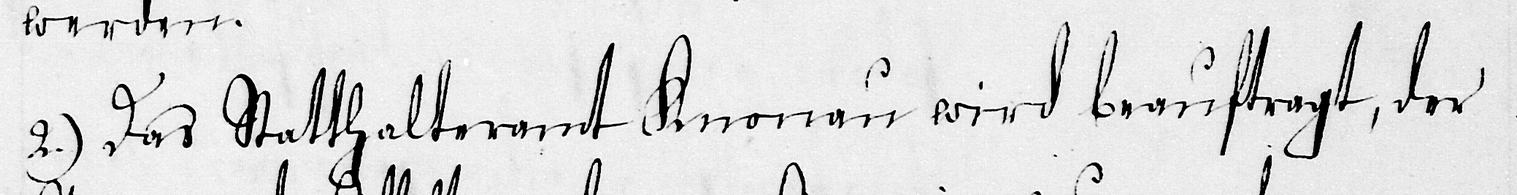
2.) Das Statthalteramt Knonau wird beauftragt, der
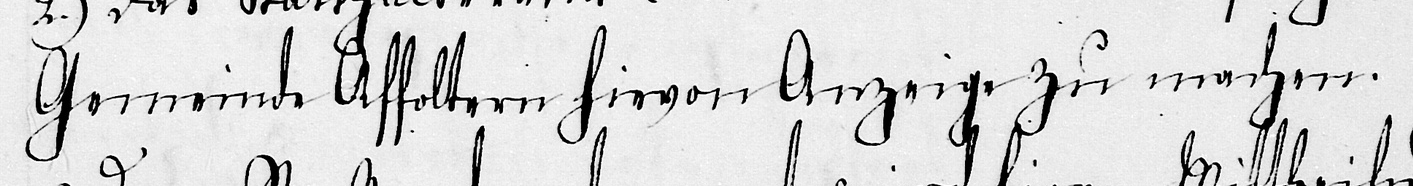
Gemeinde Affoltern hievon Anzeige zu machen.
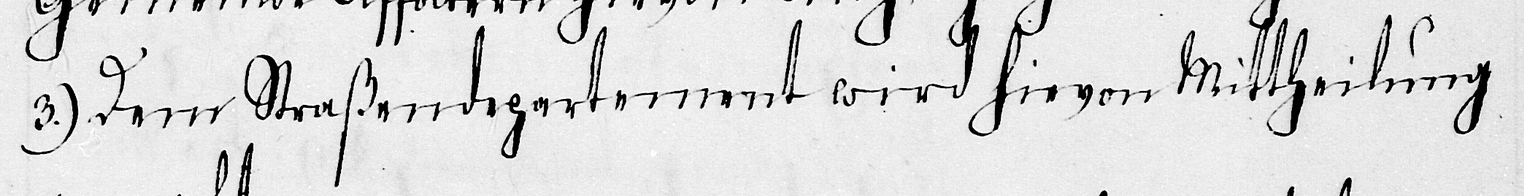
3.) Dem Straßendepartement wird hievon Mittheilung
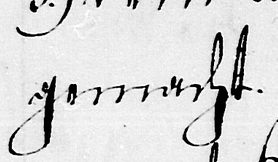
gemacht.
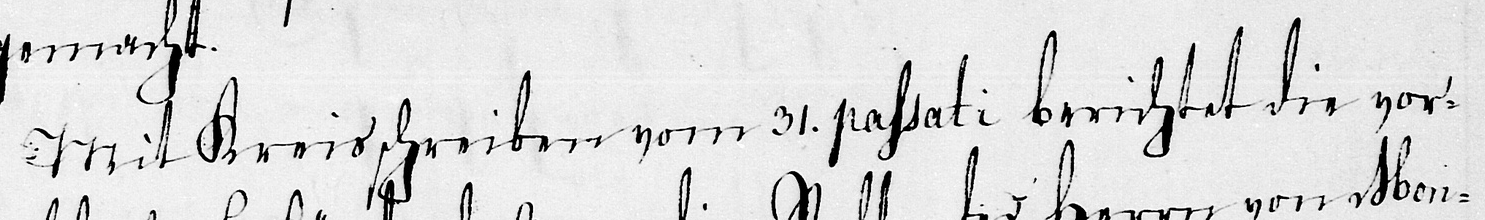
Mit Kreisschreiben vom 31. passati berichtet die vor¬
